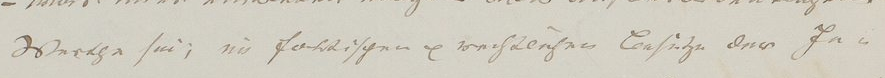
Werthe sei, im faktischen u. rechtlichen Besitze der In-
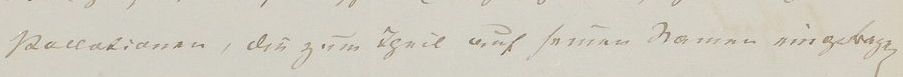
stallationen, die zum Theil auf seinen Namen eingetragen
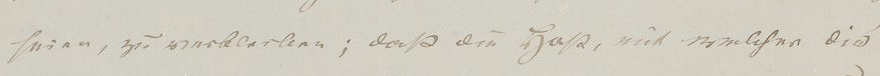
seien, zu verbleiben; daß die Hast, mit welcher die
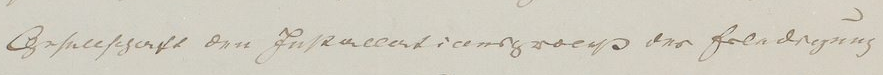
Gesellschaft den Installationsproceß der Erledigung
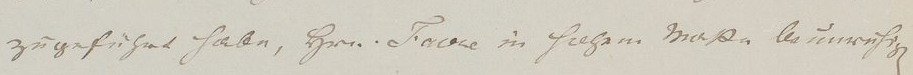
zugeführt habe, Hrn. Favre in hohem Maße beunruhigen
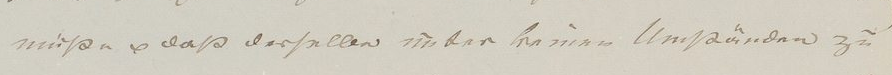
müße u. daß derselbe unter keinen Umständen zu
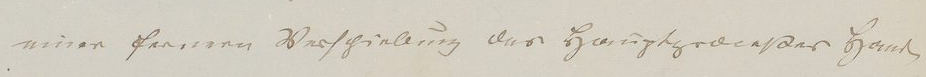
einer fernern Verschiebung des Hauptproceßes Hand
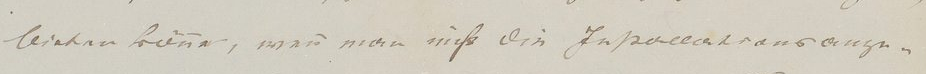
bieten könne, wenn man nicht die Installationsange-
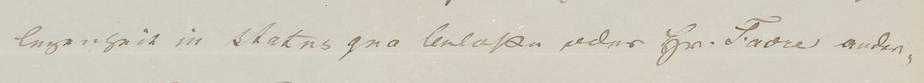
legenheit im status quo belaße oder Hr. Favre ander-
